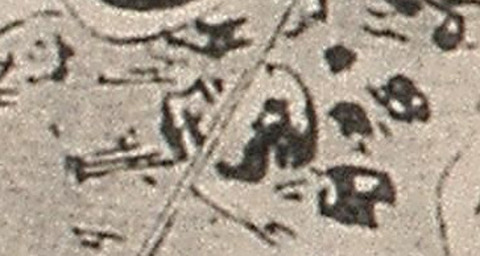十九）

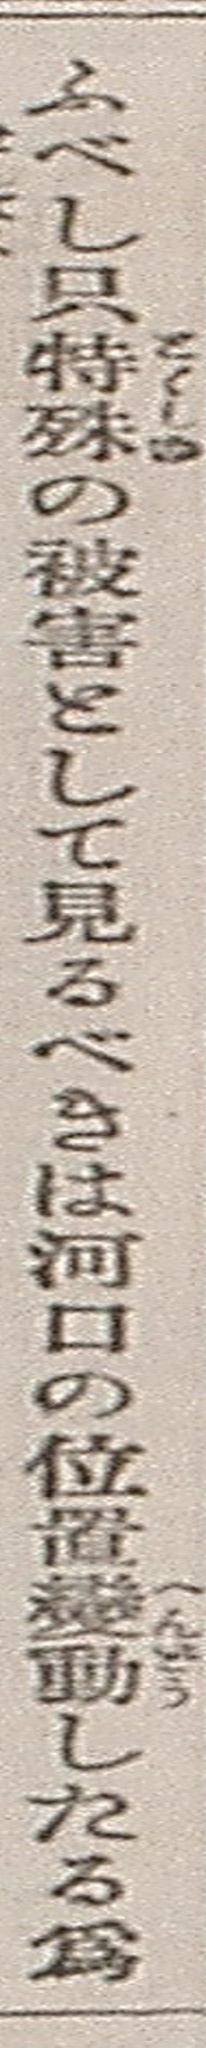ふべし只特殊の被害として見るべきは河口の位置変動したる為
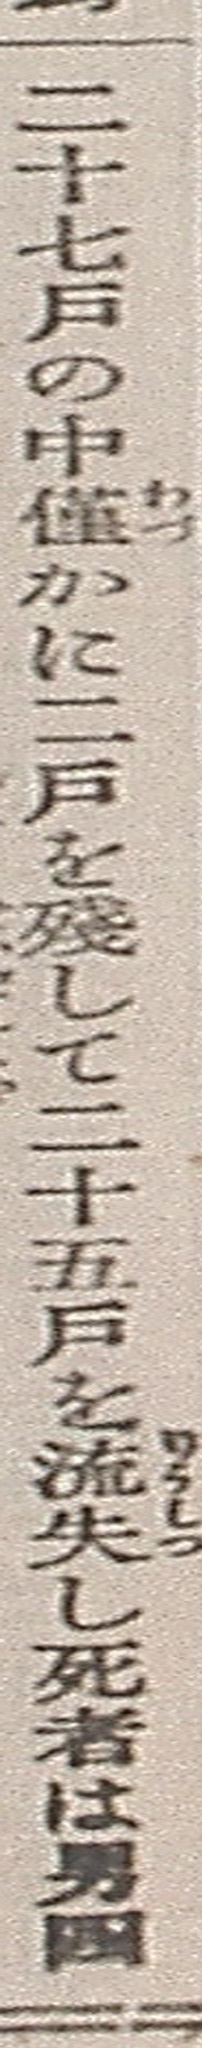二十七戸の中僅かに二戸を残して二十五戸を流失し死者は男四
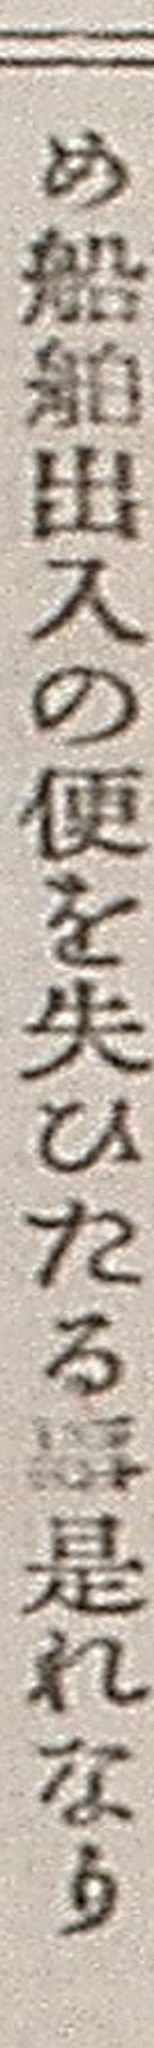め船舶出入の便を失ひたる事是れなり
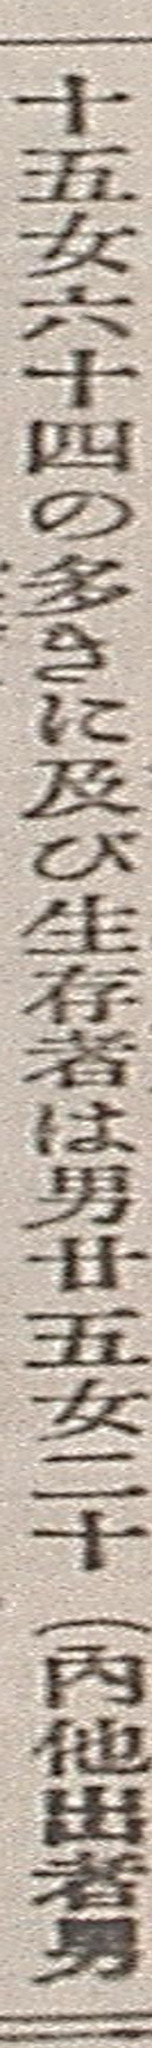十五女六十四の多きに及び生存者は男廿五女二十（内他出者男
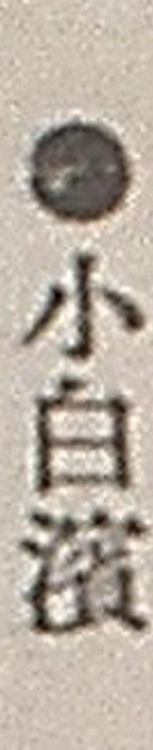●小白浜
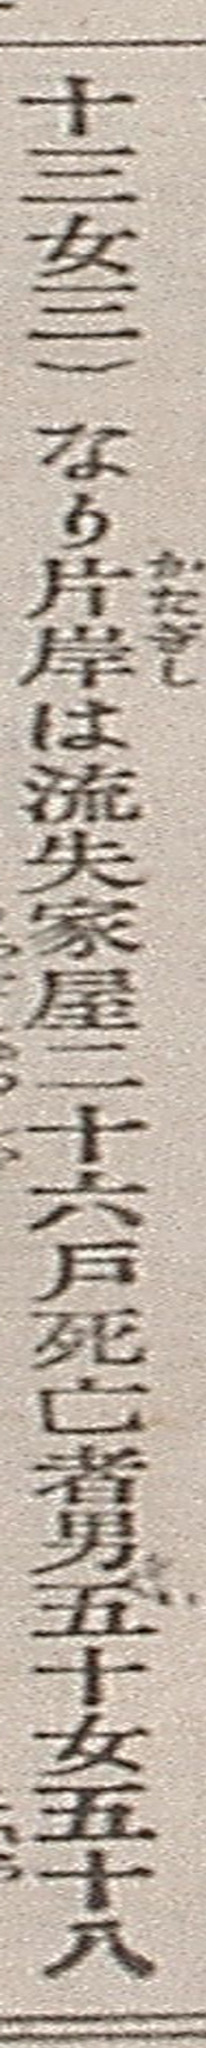十三女三）なり片岸は流失家屋二十六戸死亡者男五十女五十八
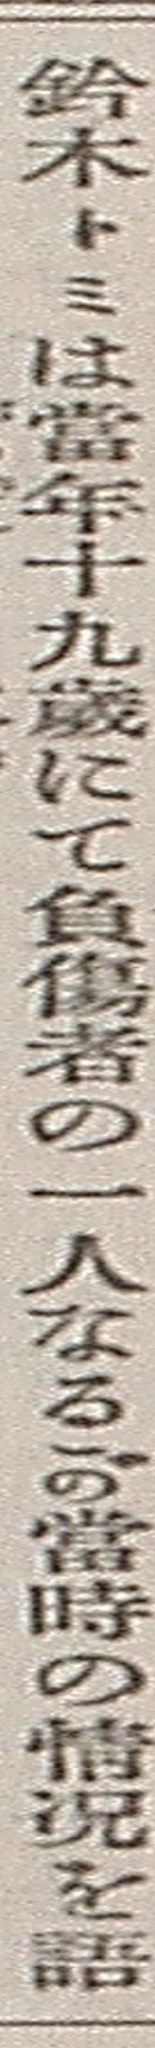鈴木トミは当年十九歳にて負傷者の一人なるが当時の情况を語
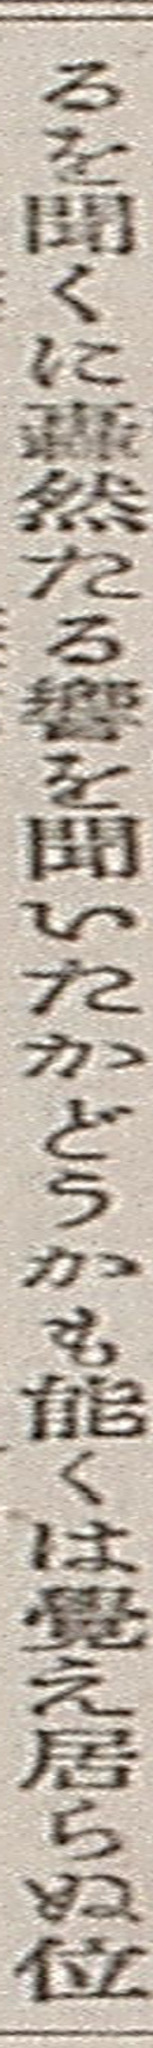るを聞くに轟然たる響を聞いたかどうかも能くは覚え居らぬ位
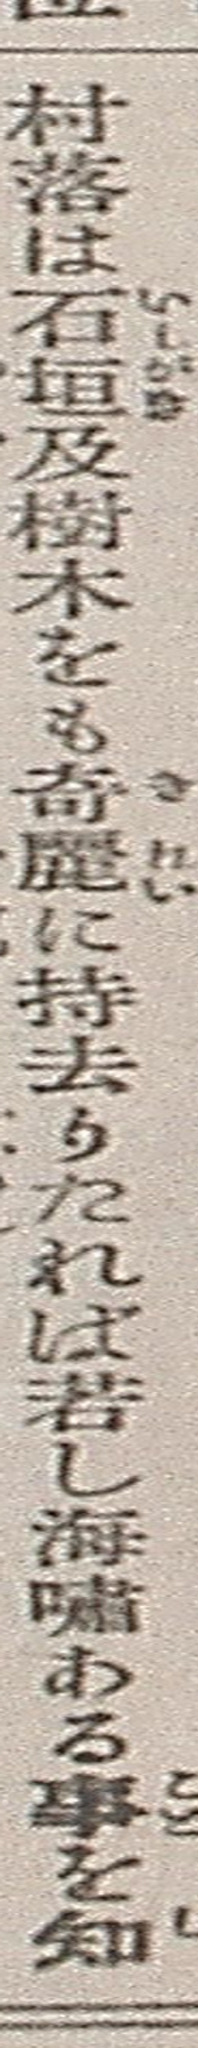村落は石垣及樹木をも奇麗に持去りたれば若し海嘯ある事を知
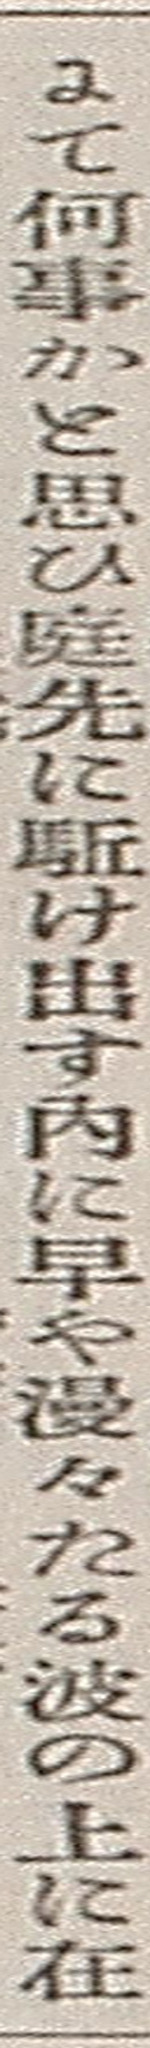にて何事かと思ひ庭先に駈け出す内に早や漫々たる波の上に在
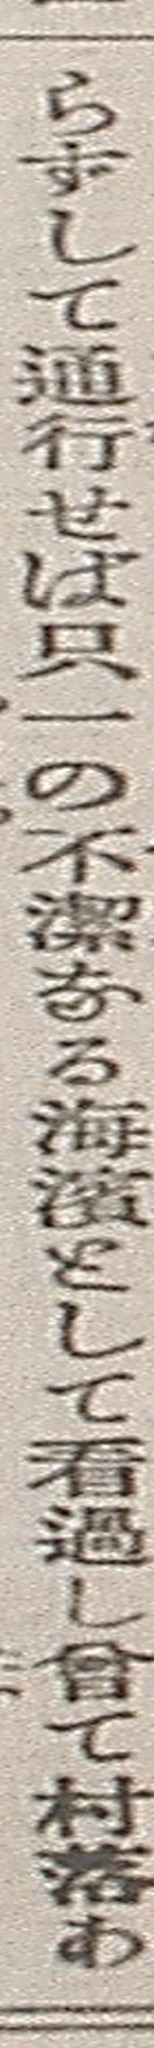らずして通行せば只一の不潔なる海浜として看過し曾て村落あ
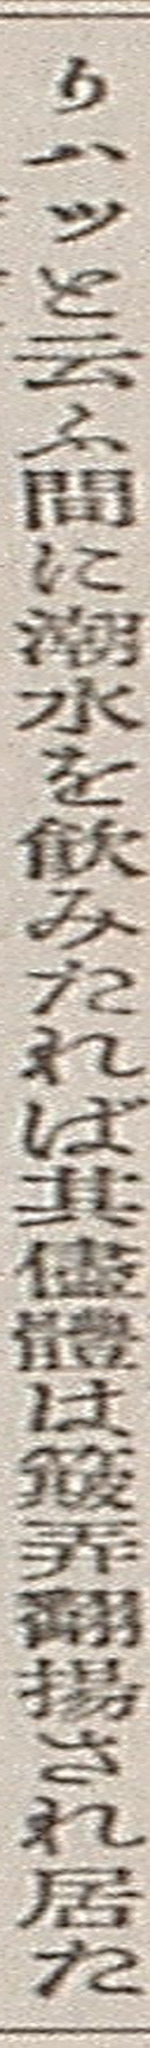りハッと云ふ間に潮水を飲みたれば其侭体は簸弄翻揚され居た
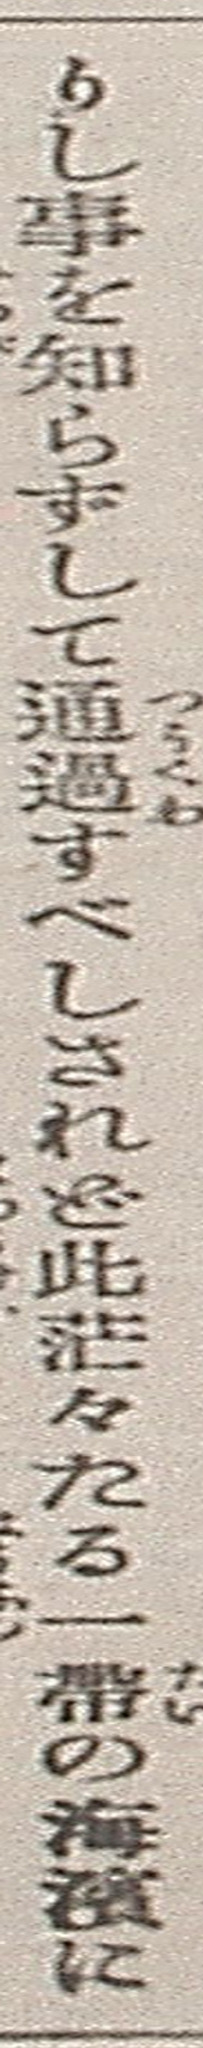りし事を知らずして通過すべしされど此茫々たる一帯の海浜に
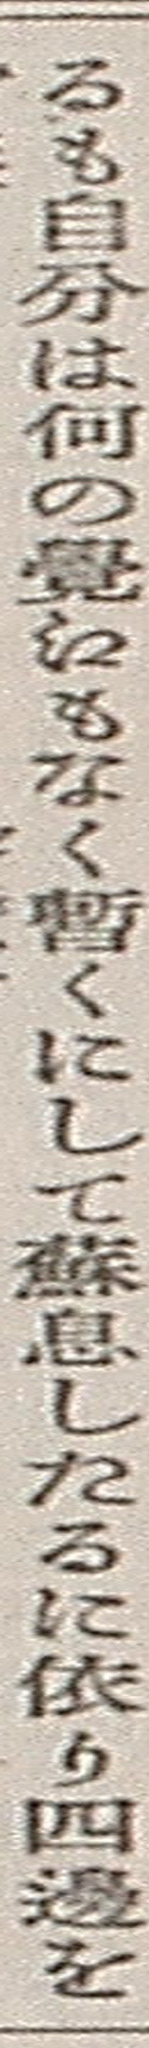るも自分は何の覚えもなく暫くにして蘇息したるに依り四辺を
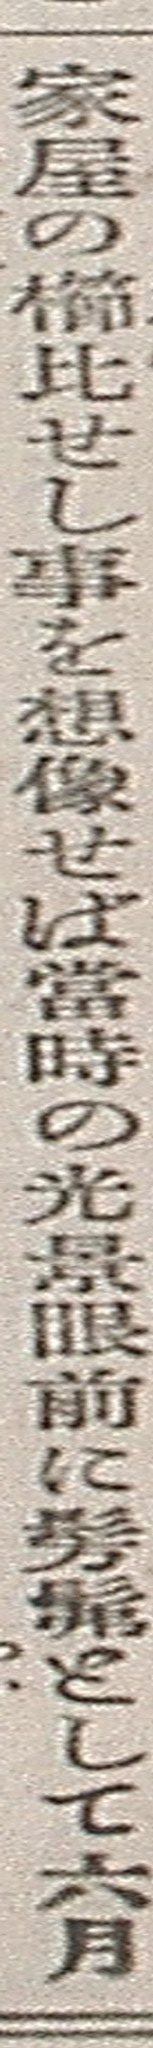家屋の櫛比せし事を想像せば当時の光景眼前に髣髴として六月
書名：風俗畫報臨時増刊第百十九號　大海嘯被害録（中）
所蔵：東京大学地震研究所図書室 Earthquake Research Institute Library, The University of Tokyo, JAPAN
